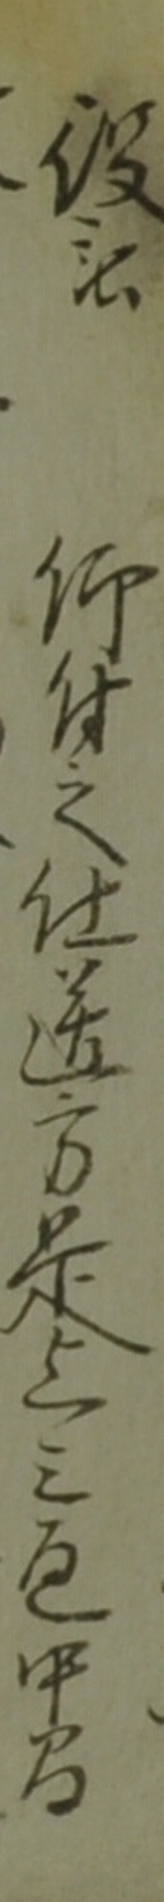役被仰付之仕送方是迄之通中間
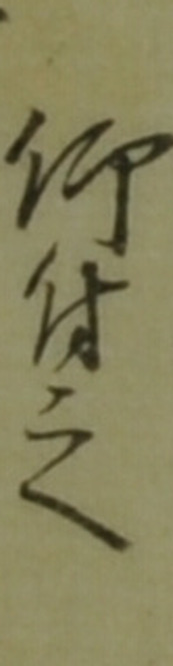仰付之
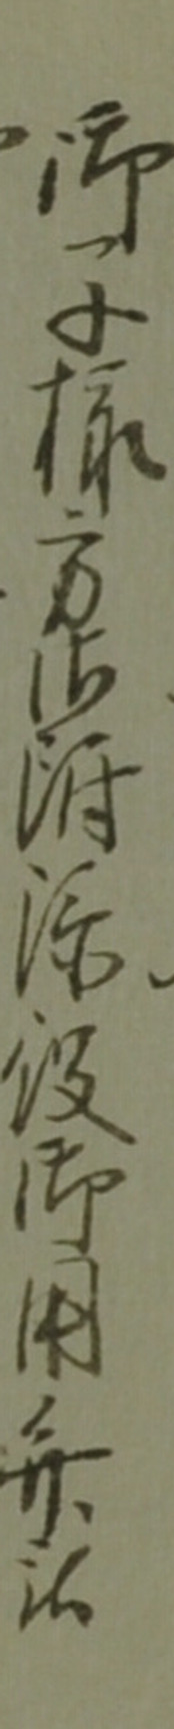御子様方御附添役御用弁被
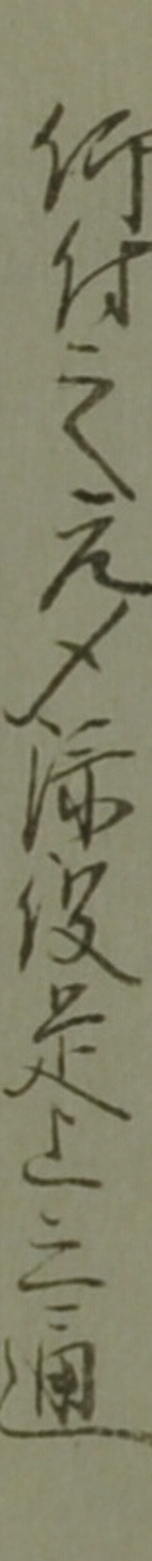仰付之元〆添役是迄之通
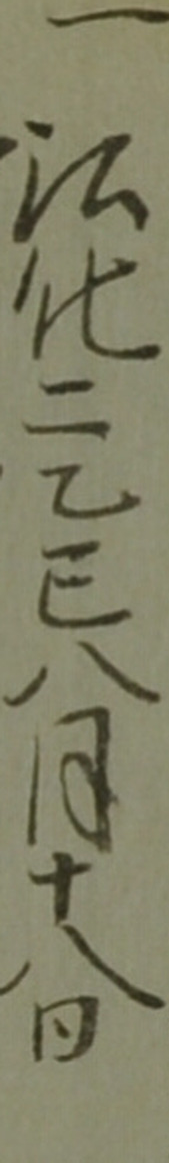一弘化二乙巳八月十八日
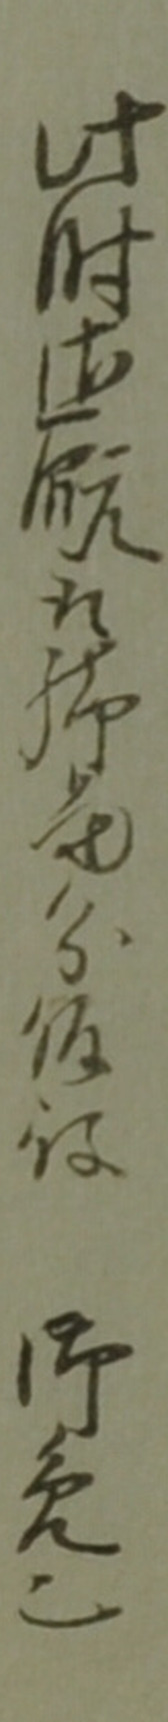此時御厩取締当分仮役御免也

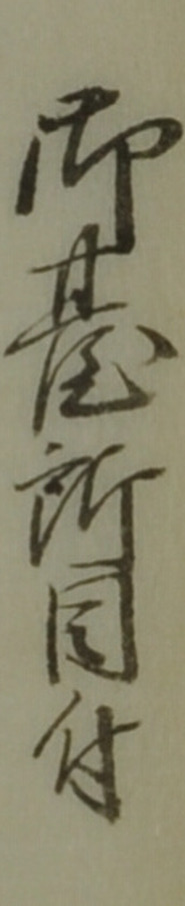御台所目付
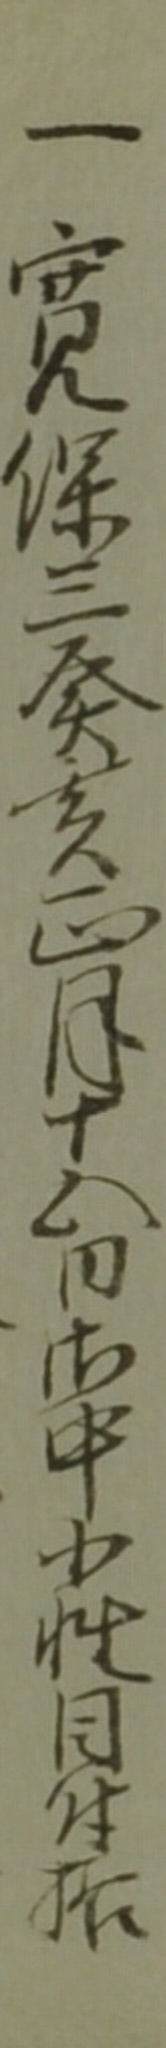一寛保三癸亥正月十八日御中小姓目付格
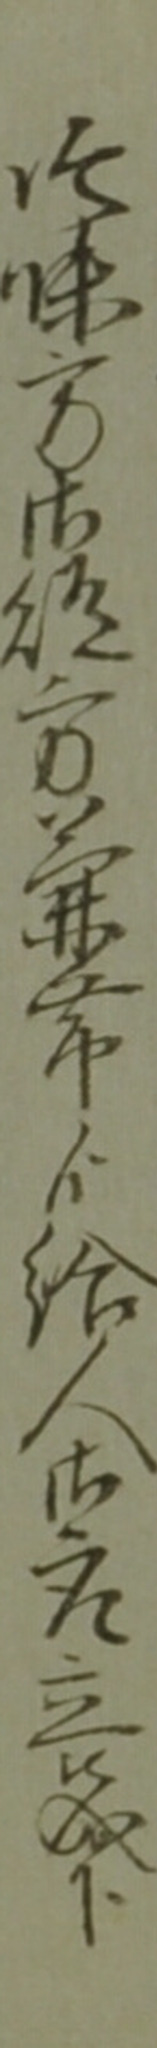吟味方御賄方兼帯より給人御取立被成下
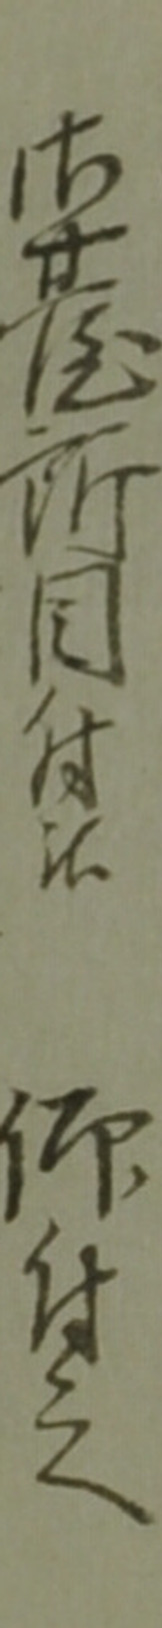御台所目付仰付之
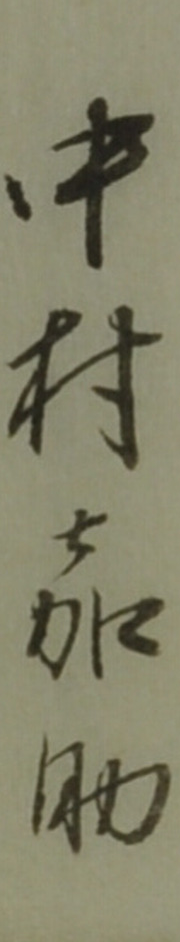中村嘉助
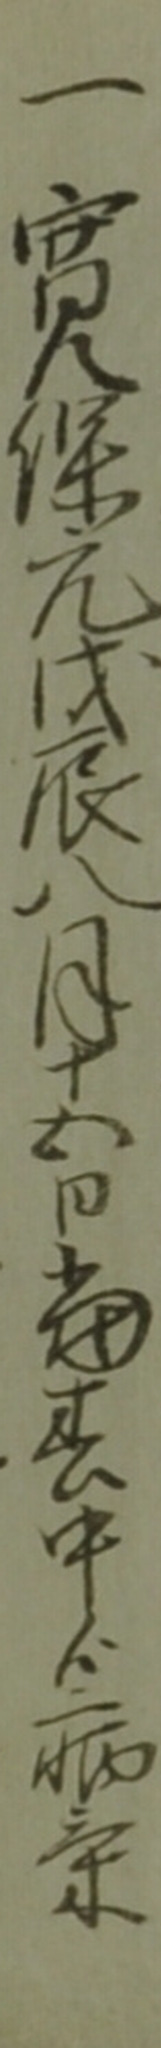一寛保元戊辰八月十五日当春中より病気
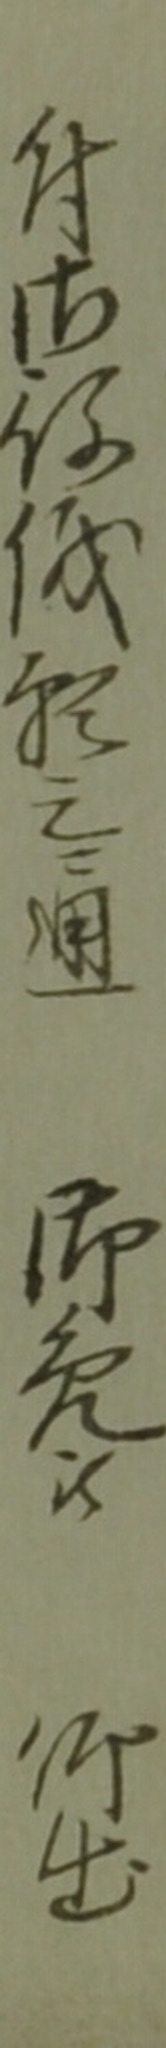付御役儀願之通御免被仰出
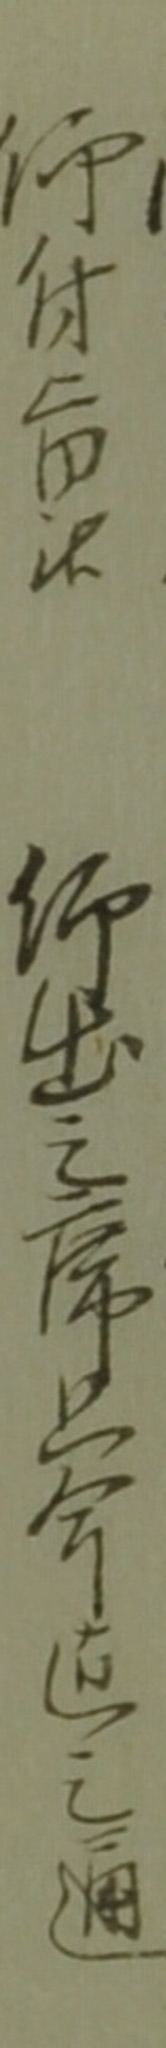仰付旨被仰出之席只今迄之通
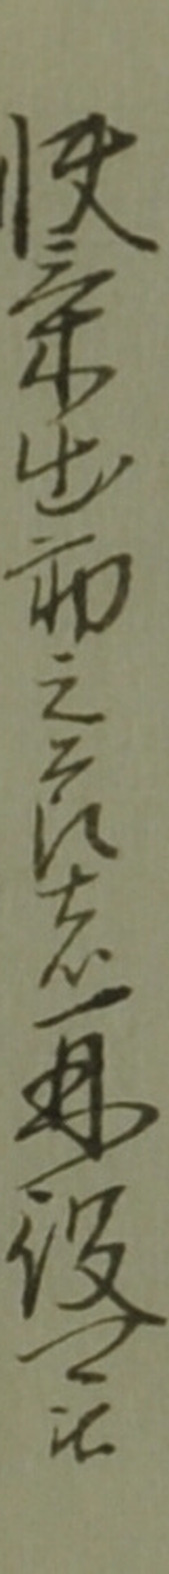快気出勤之節者再役可被

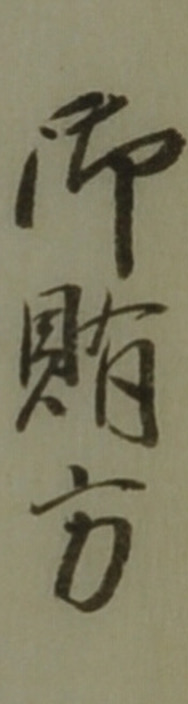御賄方
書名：諸御役代々録（八）
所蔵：伊那市立高遠町図書館・合同会社AMANE
